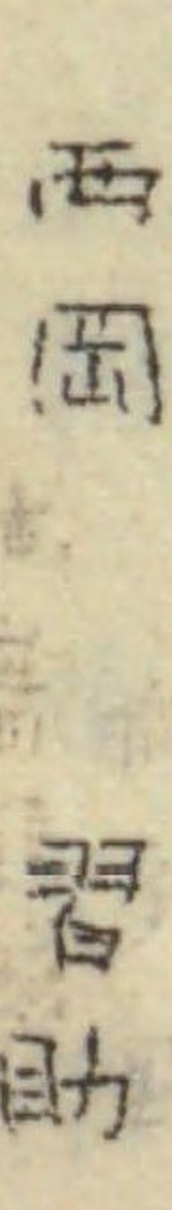西岡習助

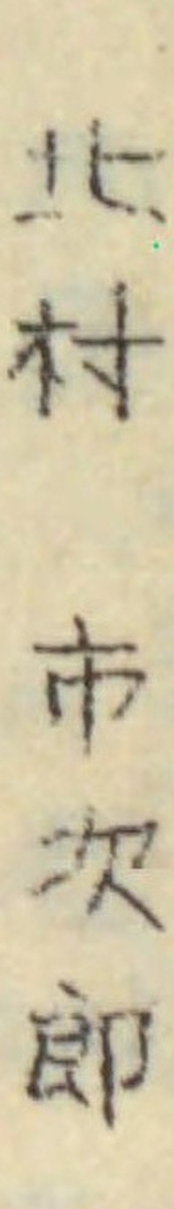北村市次郎
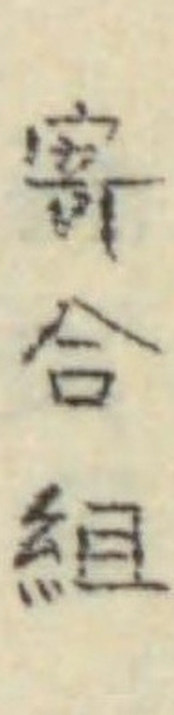寄合組
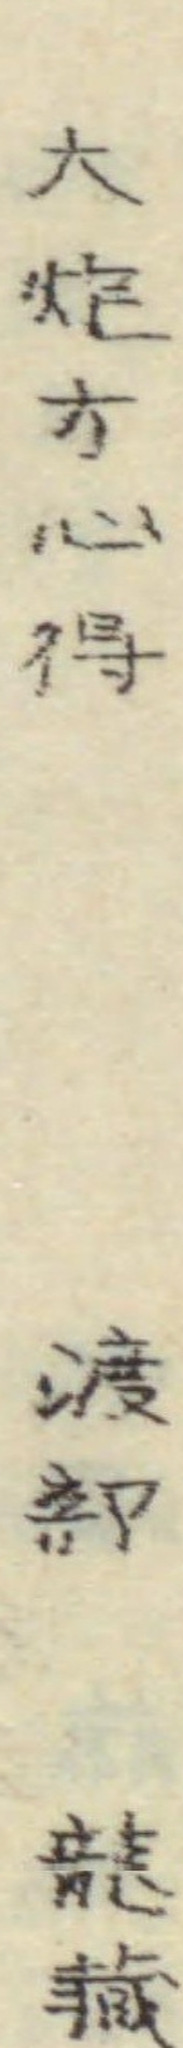大炮方心得渡部龍蔵
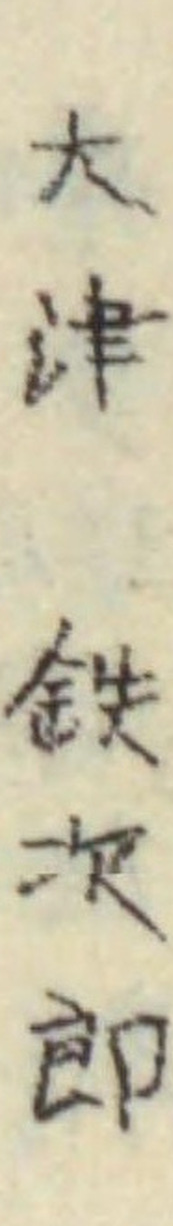大津鉄次郎
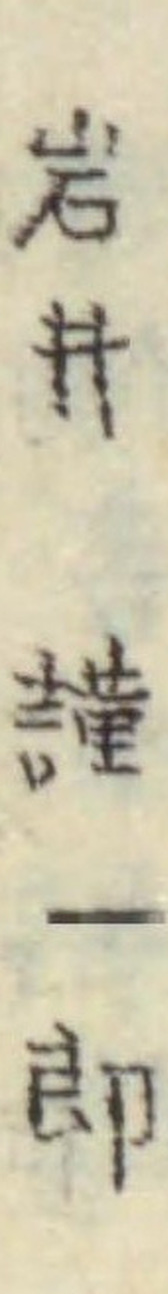岩井謹一郎
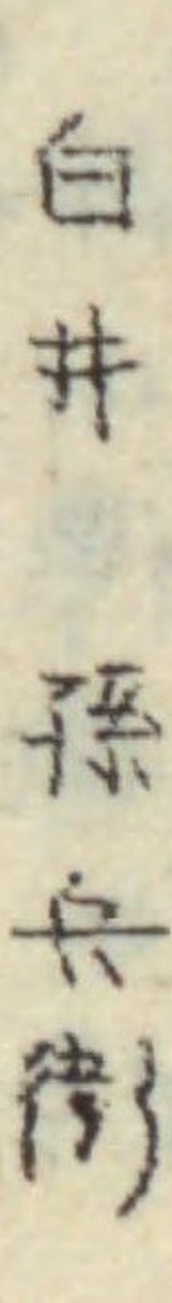白井孫兵衛
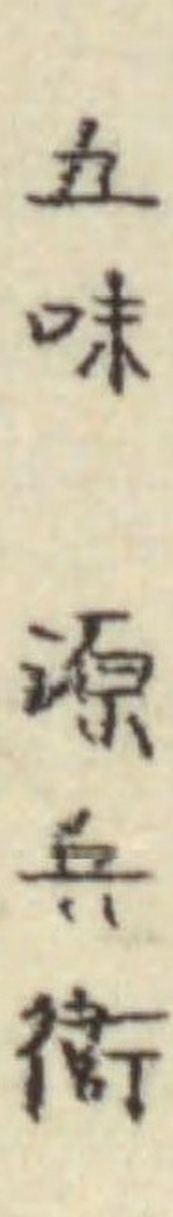五味源兵衛
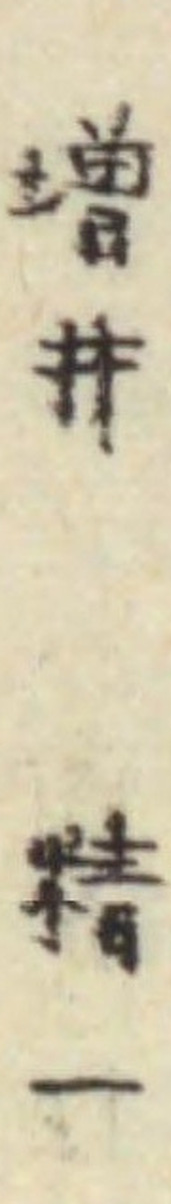増井精一
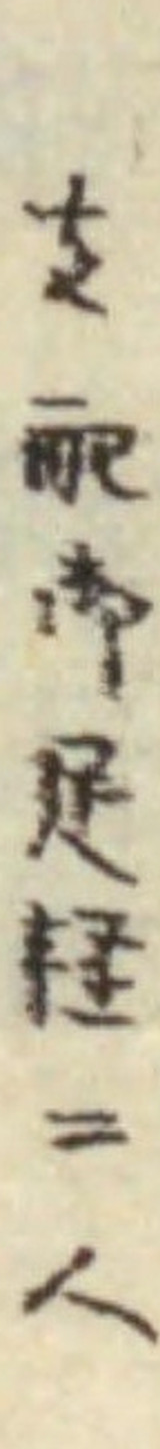支配御足軽二人
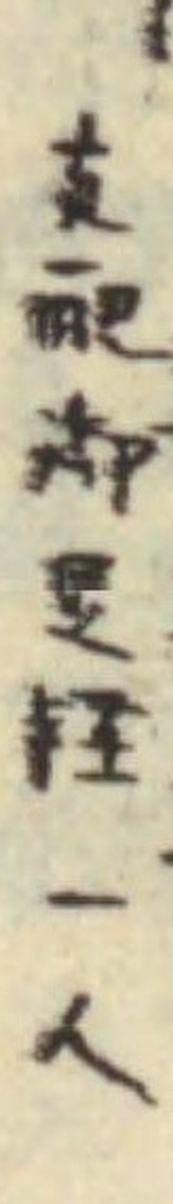支配御足軽一人
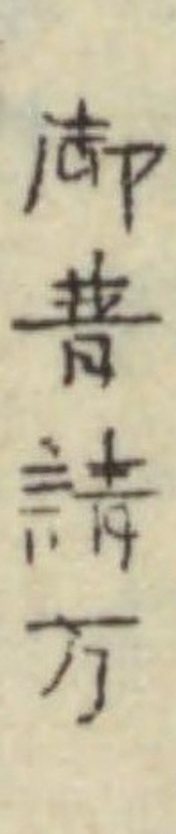御普請組
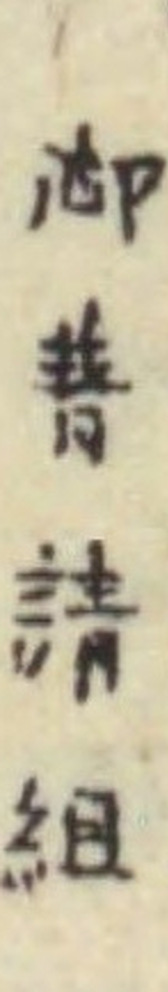御普請組
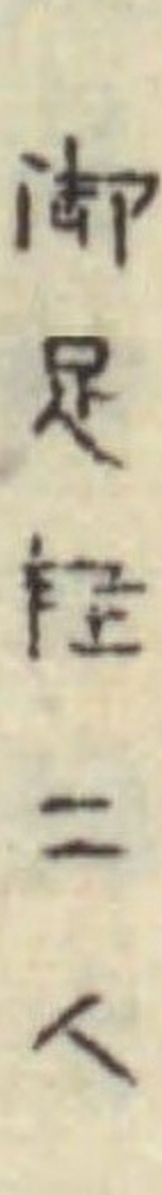御足軽二人
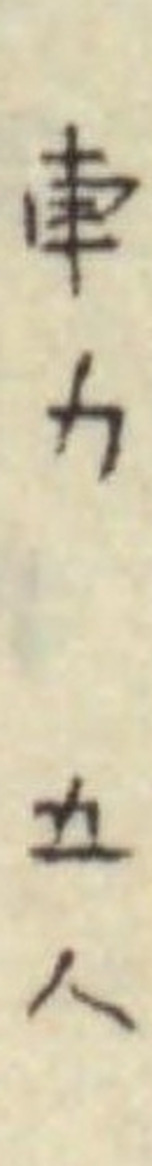車力五人
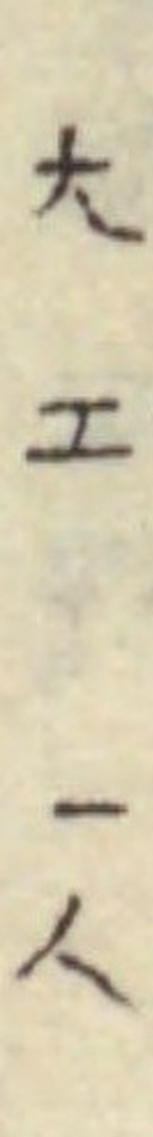大工一人
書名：三河吉田藩動員史料
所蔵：国立国会図書館 National Diet Library, JAPAN
